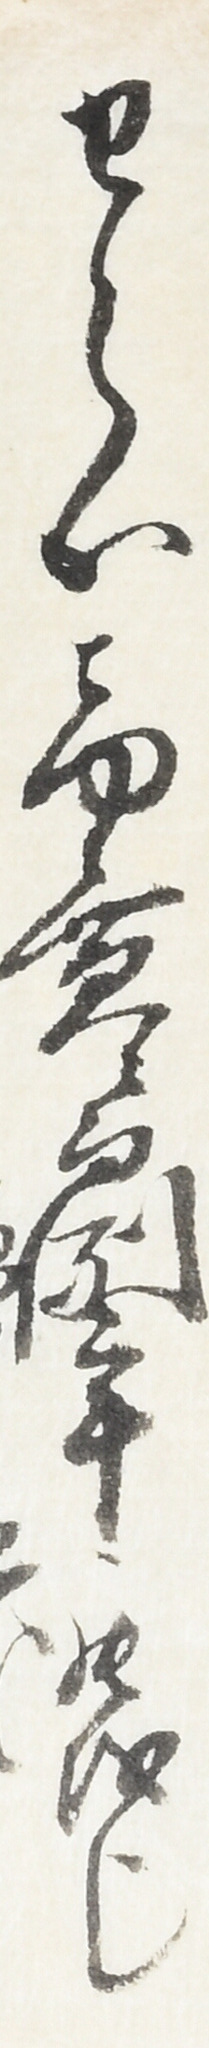せうか商売ニ而例年罷越申候
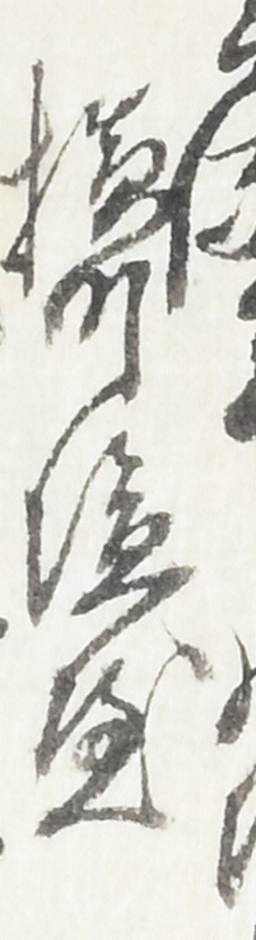横町塩屋
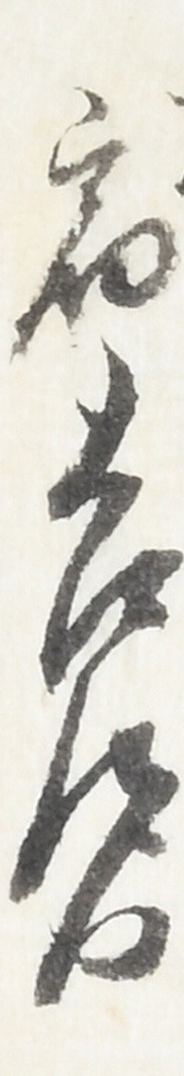宿吉左衛門

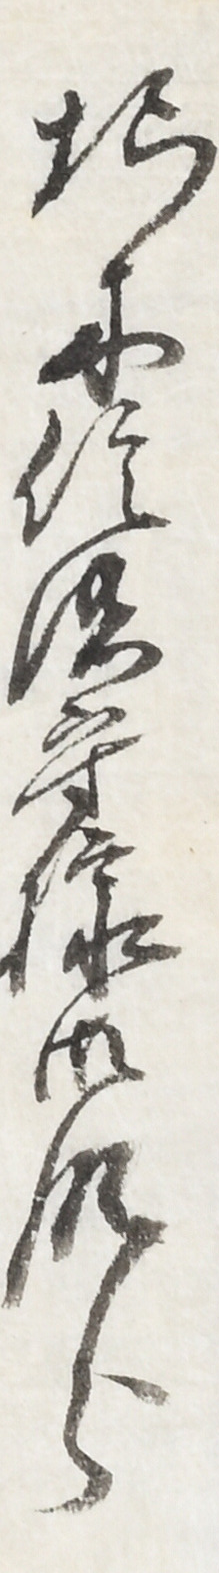朽木信濃守様御領分
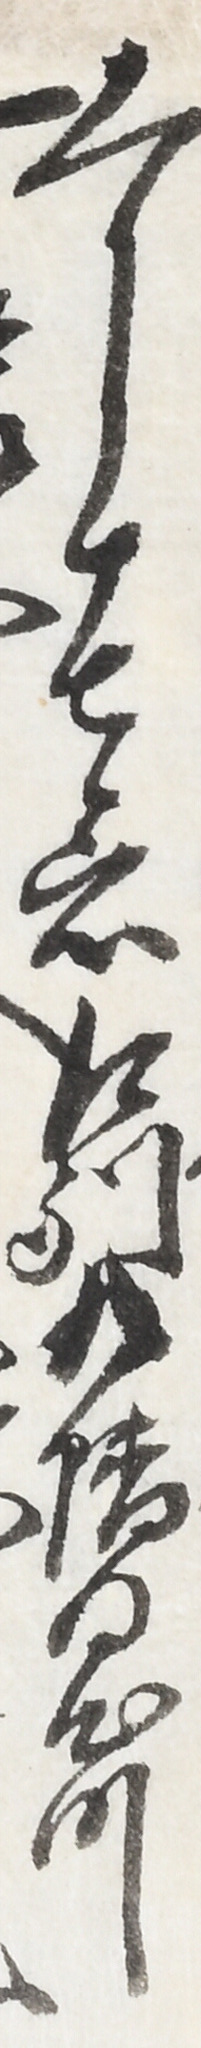十一月十七着江州八幡ゐ心町
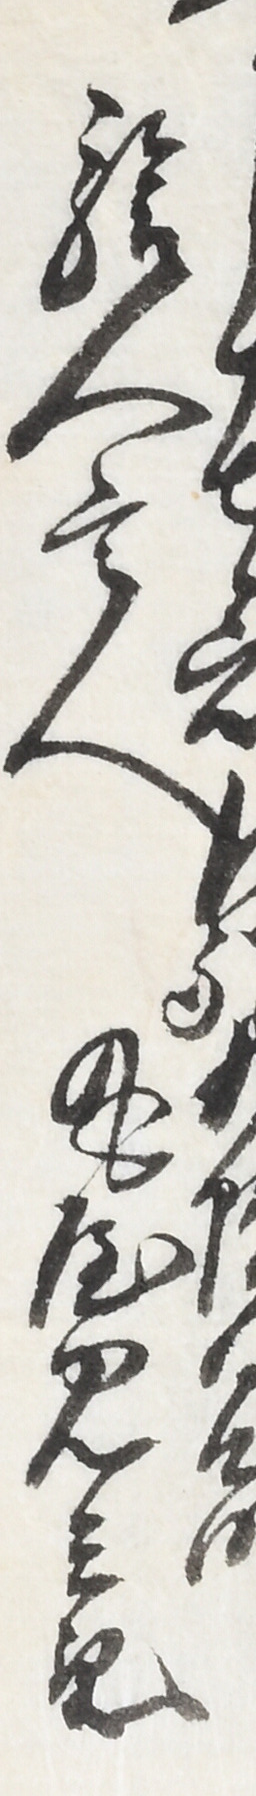一旅人壱人丸屋忠兵衛
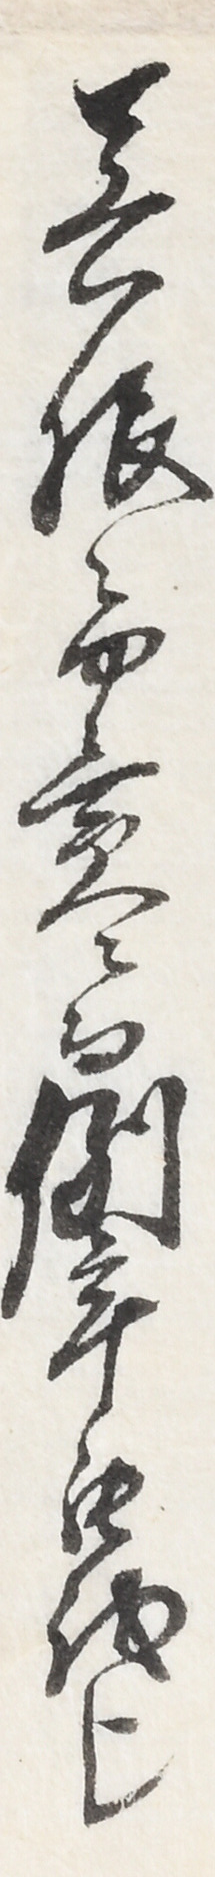呉服商売ニ而例年罷越申候
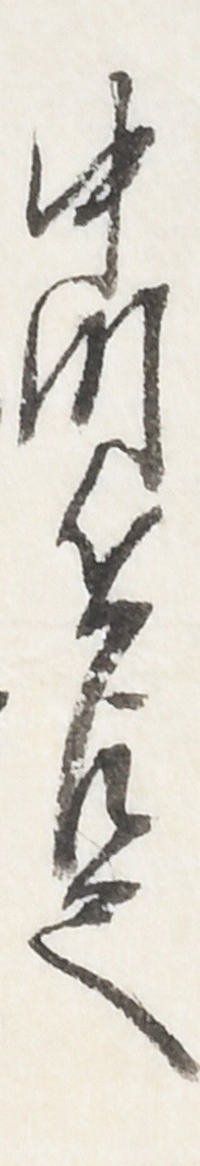中町近江屋
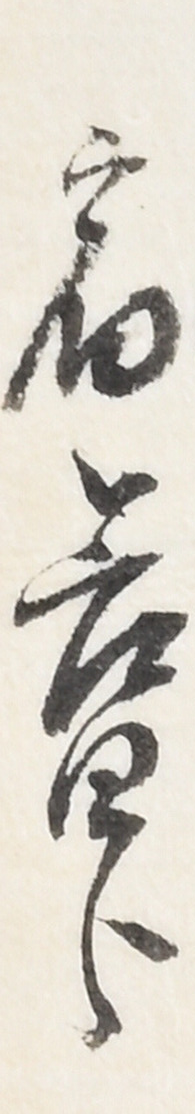宿善四郎
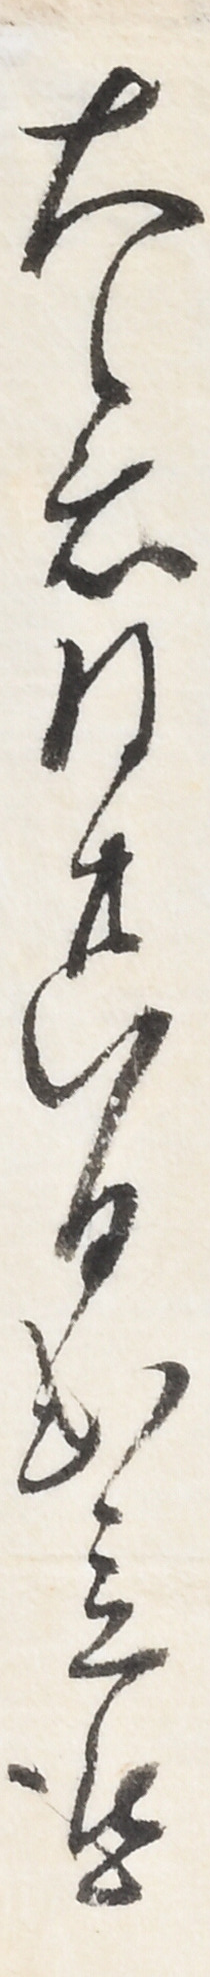右之者同廿八日出立仕候
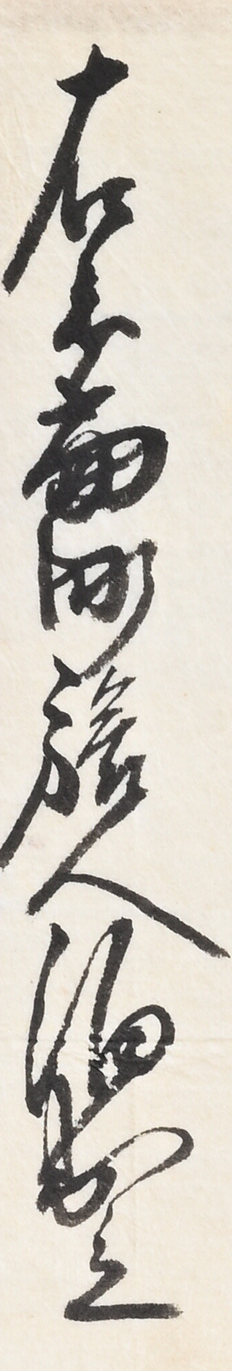右者当町旅人泊出立
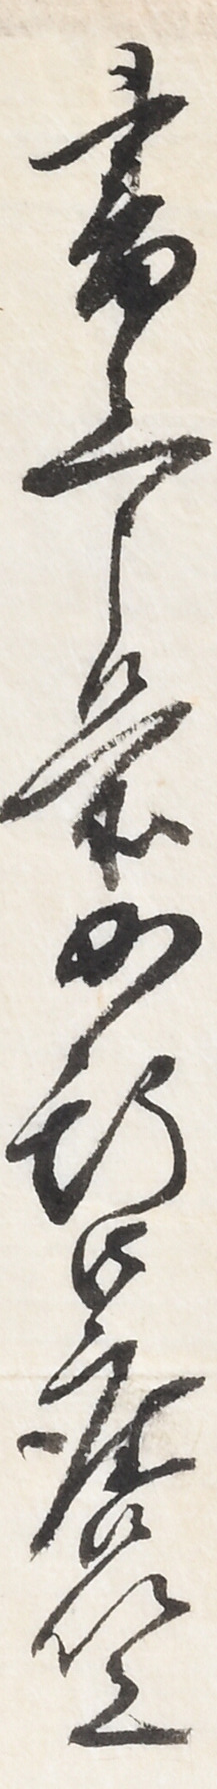書上申候所如斯御座候以上
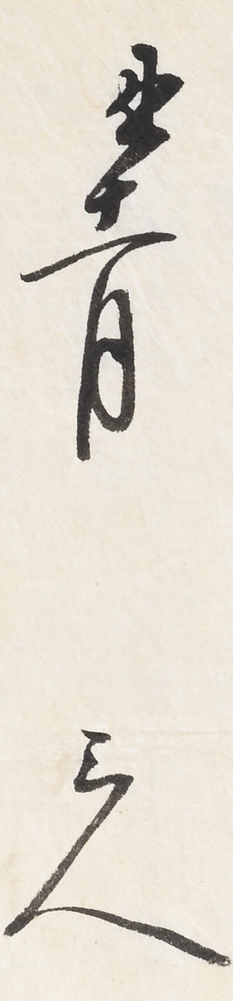丑十一月三人
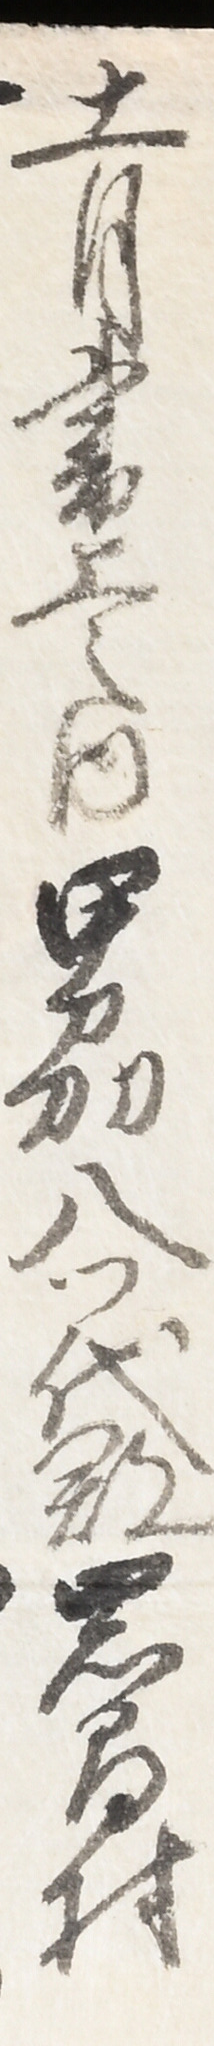十一月書上之内甲州八ツ代郡岩間村
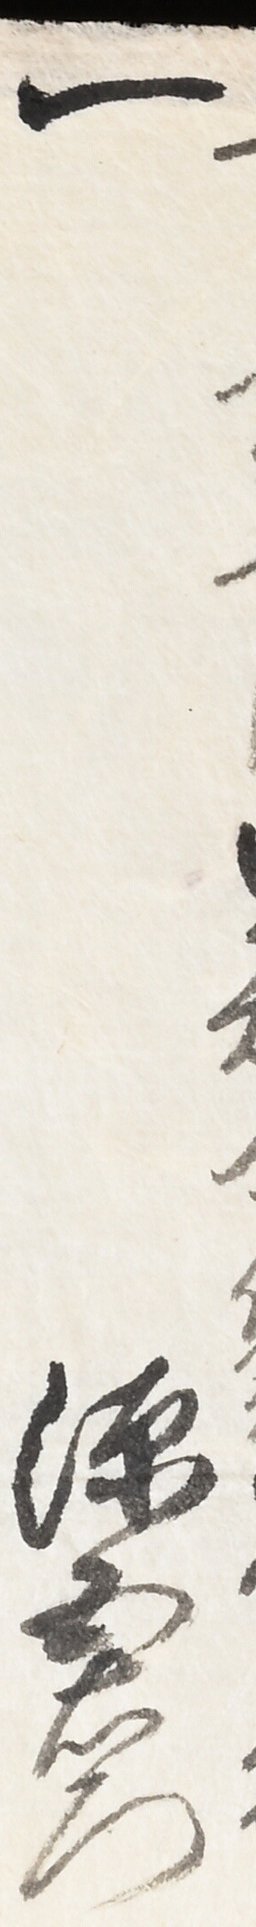一源五右衛門
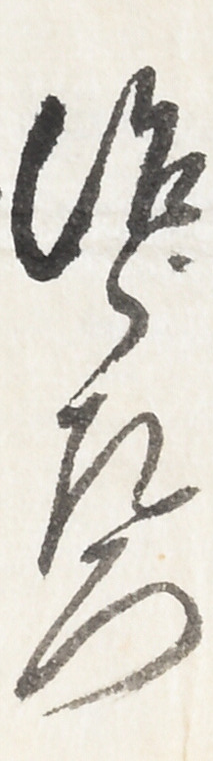治郎左衛門
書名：旅人泊控帳
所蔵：伊那市立高遠町図書館・合同会社AMANE
